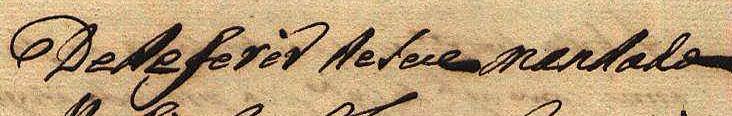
De deferir de seu mandado
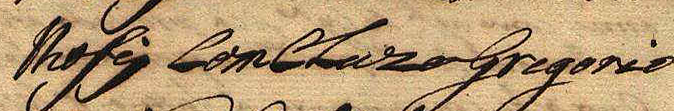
lho fis ComCLuzo Gregorio
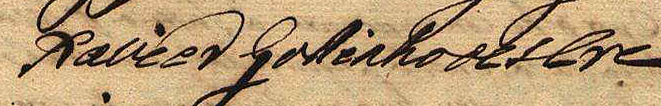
Xavier Godinho o esCre
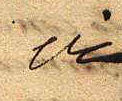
vi
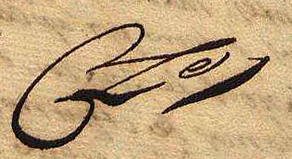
CLos
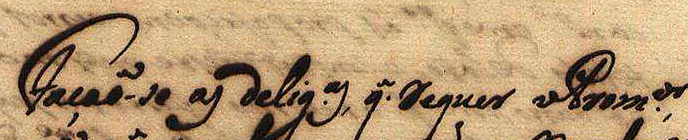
Façaõ se as delig.as, q̄ Requer o Prom.or,
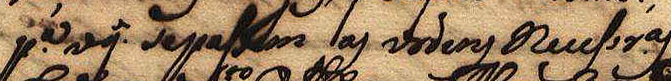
p.a o q̄ se passem as ordens Necessr.as
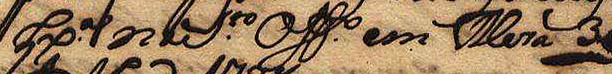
Lx.a no S.to Off.o em Mesa 3
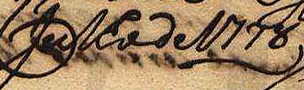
Julho de 1778
